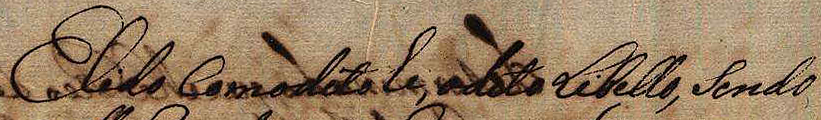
E lido Como dito he, o dito Libello, sendo
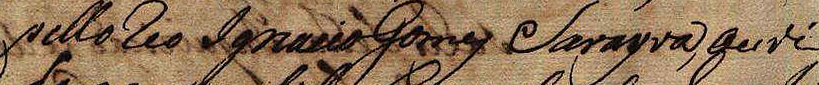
pello Reo Ignacio Gomes Sarayva, ouvi
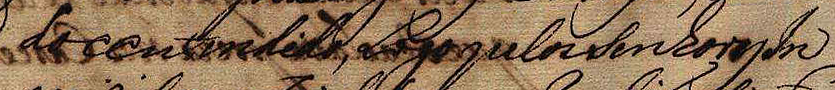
do e entendido, Logo pelos Senhores In
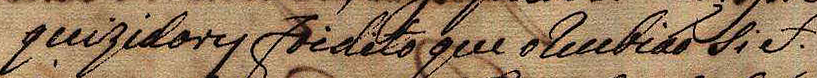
quizidores foi dito que o Recebião si et.
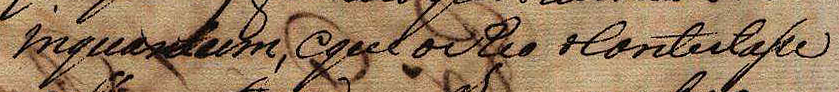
in quantum, e que o Reo o Contestasse
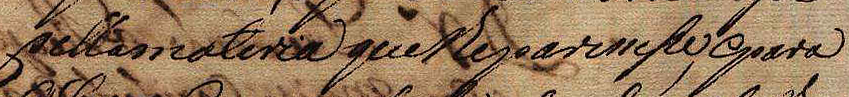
pella materia que lhe paressesse, e para
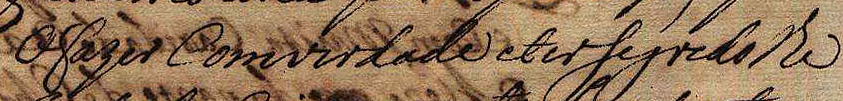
O fazer Com verdade e ter segredo lhe
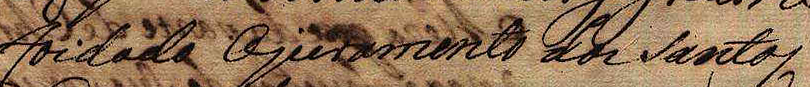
foi dado O juramento dos santos
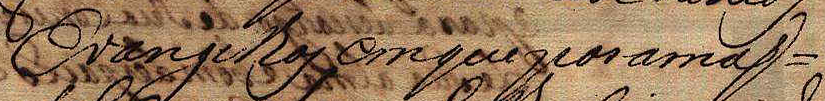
Evangelhos em que pos a maõ
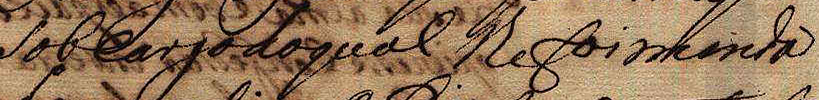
sob cargo do qual lhe foi manda
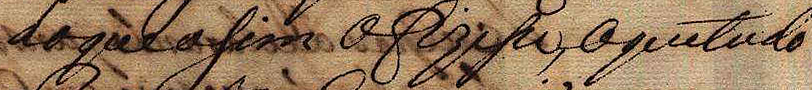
do que asim o fizesse, o que tudo
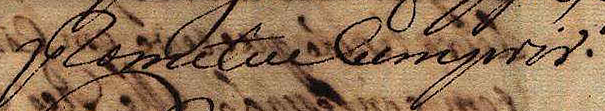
pRometeu Cumprir.
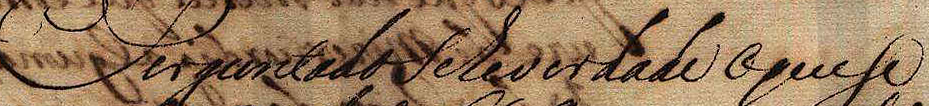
Perguntado se he verdade o que se
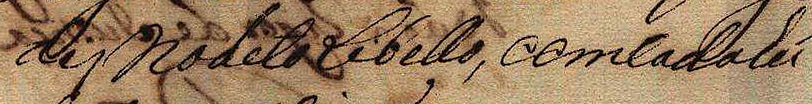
dis no dito Libello, e em cada hū
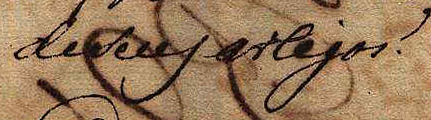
de seus artigos?
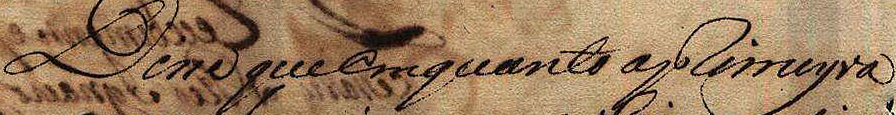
Disse que emquanto a pRimeyra
